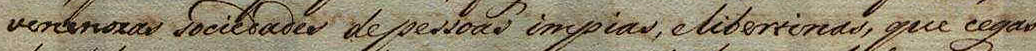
venenozas sociedades de pessoas impias, e libertinas, que cegas
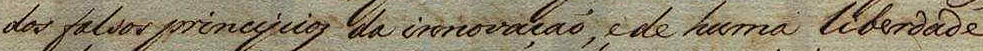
dos falsos principios da innovaçaõ, e de huma liberdade
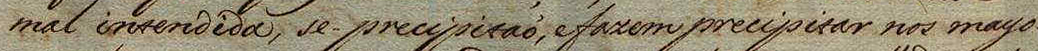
mal intendida, se-precipitaõ, e fazem precipitar nos mayo
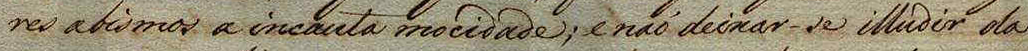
res abismos a incauta mocidade; e naõ deixar-se illudir da
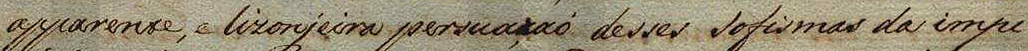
apparente, e lizonjeira persua_aõ desses sofismas da impi
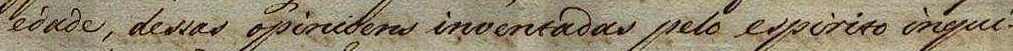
edade, dessas opinioens inventadas pelo espirito inqui
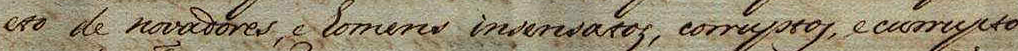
eto de novadores, e homens insensatos, corruptos, e corrupto
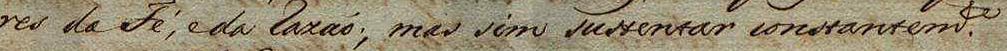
res da Fé, e da Razaõ; mas sim sustentar constantem.te
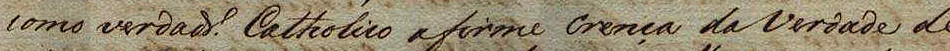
como verdad.o Catholico a firme crença da verdade de
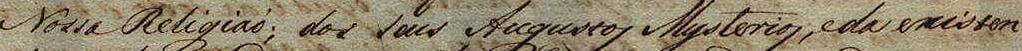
Nossa Religiaõ; dos seus Augustos Mysterios, e da existen
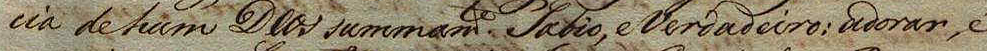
cia de hum Deos summam.te sabio, e verdadeiro: adorar, e
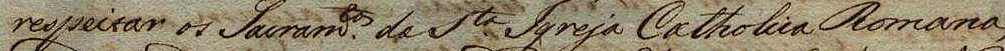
respeitar os Sacram.tos da S.ta Igreja Catholica Romana,
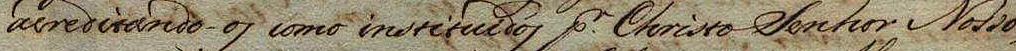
acreditando-os como instituidos p.r Christo Senhor Nosso,
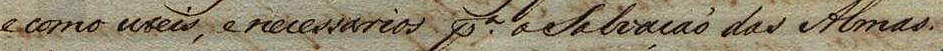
e como uteis, e necessarios p.a a Salvaçaõ das Almas.
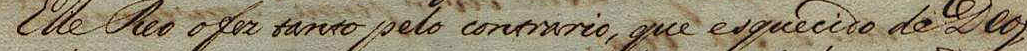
Elle Reo o fez tanto pelo contrario, que esquecido de Deos,
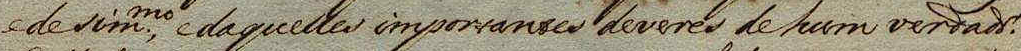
e de sim.mo, e daquelles importantes deveres de hum verdad.ro
